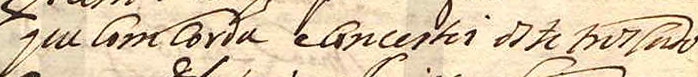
que comcorda e concertei este treslado
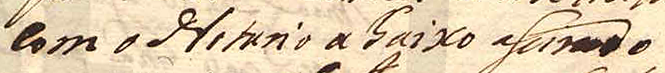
com o Notario abaixo assinado
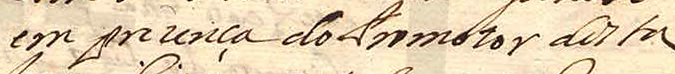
em prezença do Promotor desta
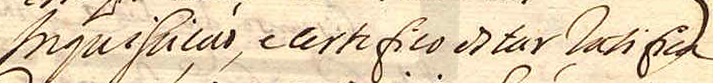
Jnquissicaõ, e certifico estar Ratifica
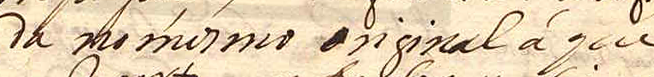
da no mesmo original á que
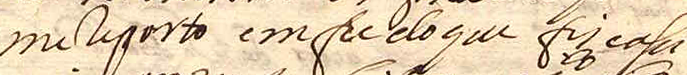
me Reporto, em fee do que fis e assi
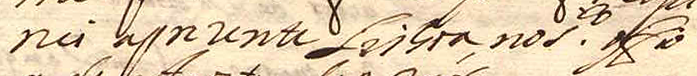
nei a prezente Lisboa, no s.to offo
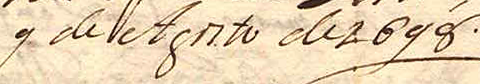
9 de Agosto de 1698.
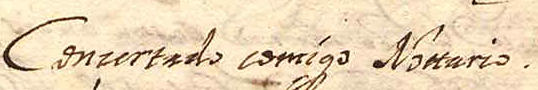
Conçertado comigo Nottario.
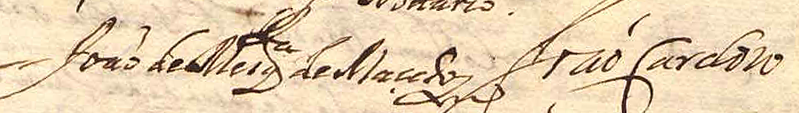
Joaõ de Mesqta de Maçedo, Joaõ Cardozo
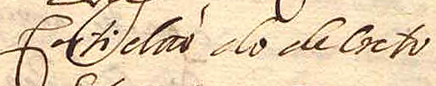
Certidaõ do decreto
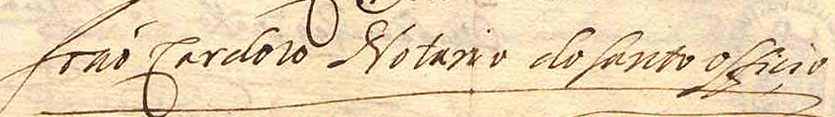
Joaõ Cardozo Notario do santo offiçio
